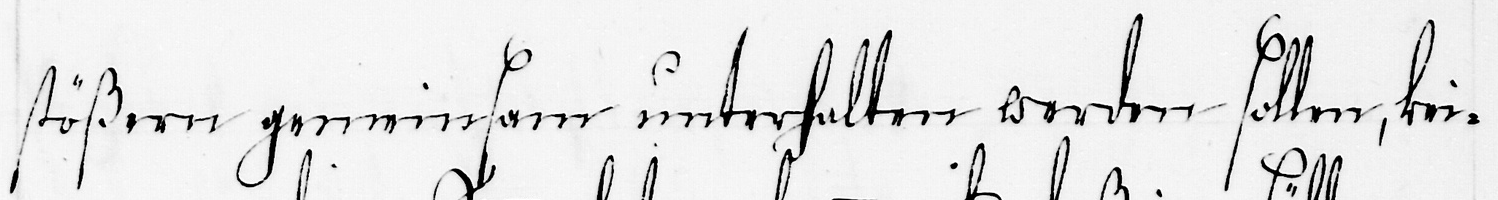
stößern gemeinsam unterhalten werden sollen, kei¬
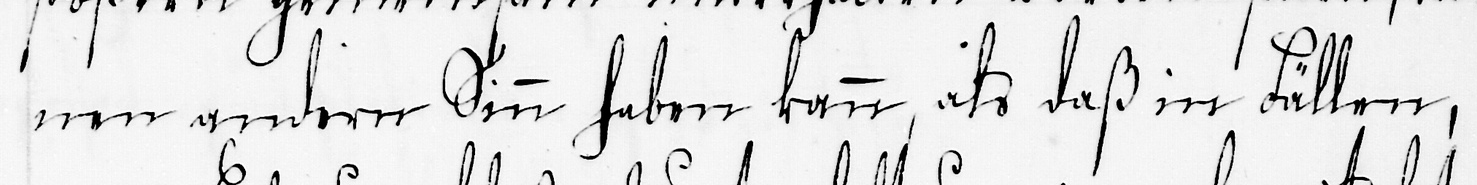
nen andern Sinn haben kann, als daß in Fällen,
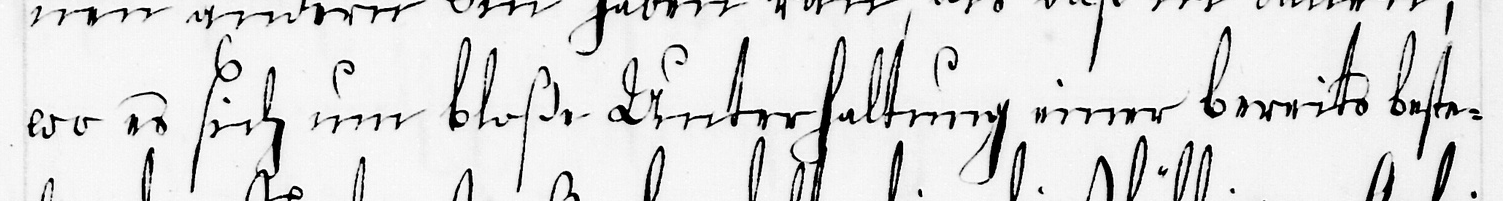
wo es sich um bloße Unterhaltung einer bereits best¬
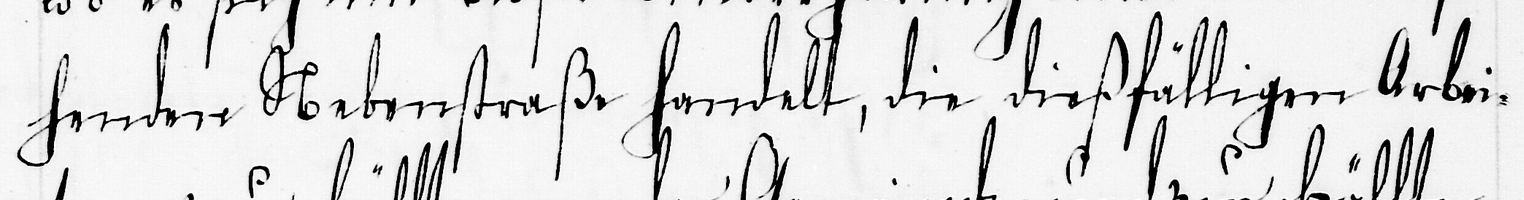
ehenden Nebenstraße handelt, die dießfälligen Arbei¬
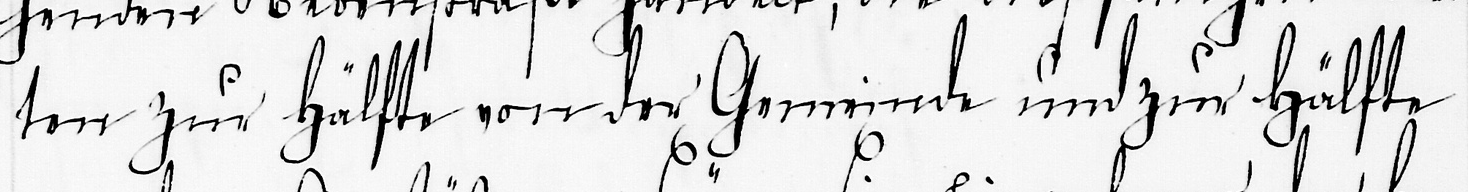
ten zur Hälfte von der Gemeinde und zur Hälfte
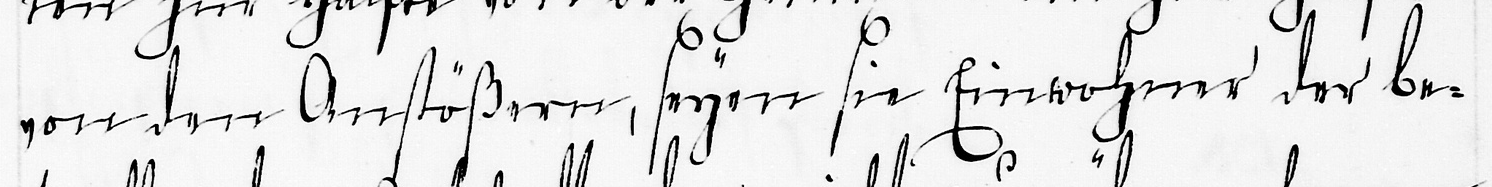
von den Anstößern, seyen sie Einwohner der be¬
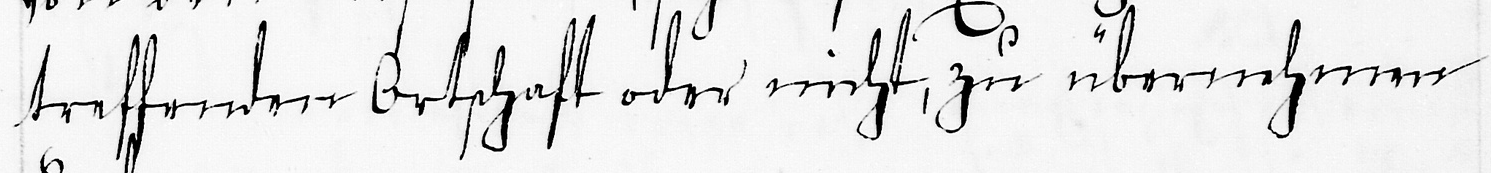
treffenden Ortschaft oder nicht, zu übernehmen
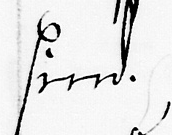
sind.
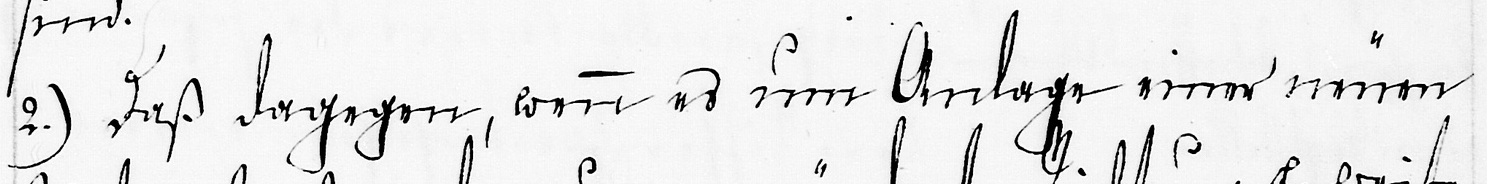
2.) Daß dagegen, wenn es um Anlage einer neuen
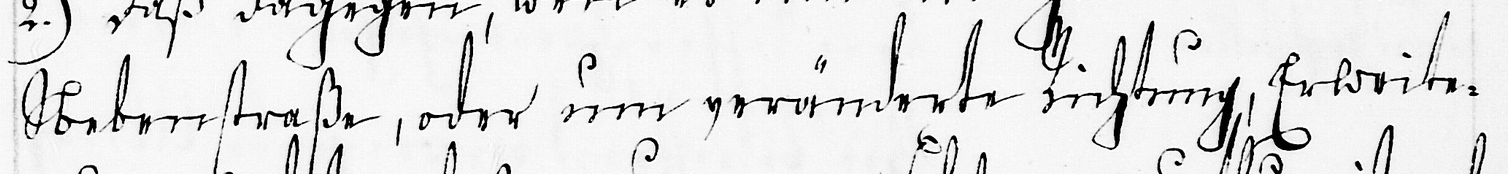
Nebenstraße, oder um veränderte Richtung, Erweite¬
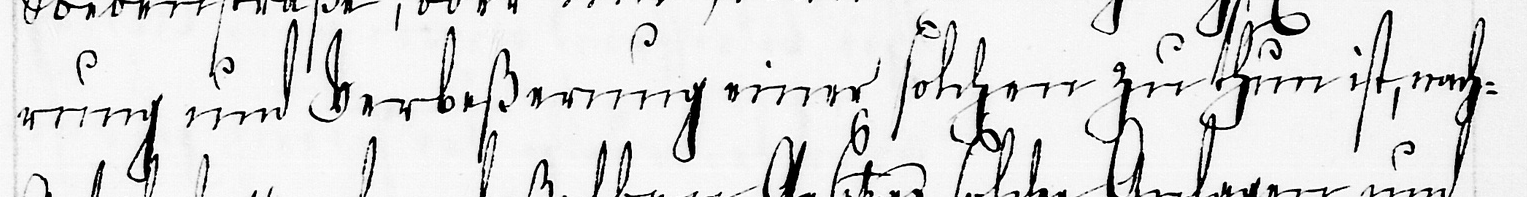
rung und Verbeßerung einer solchen zu thun ist, nach
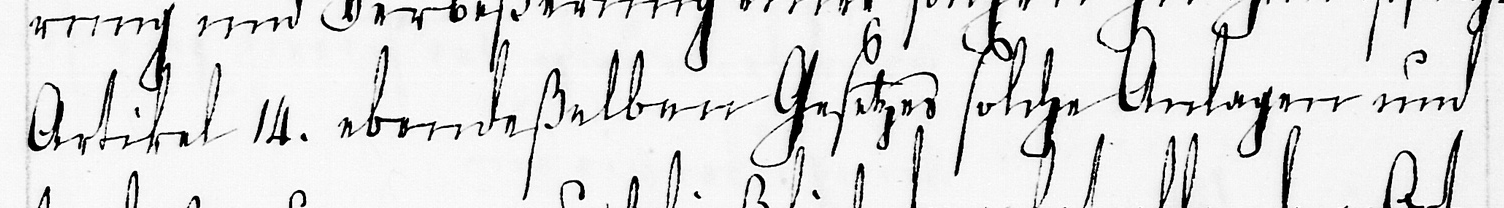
Artikel 14. ebendeßelben Gesetzes solche Anlagen und
